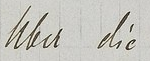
Über die
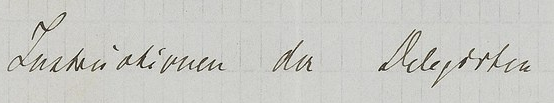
Instructionen der Delegirten
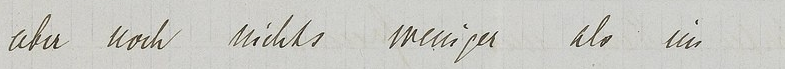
aber noch nichts weniger als im
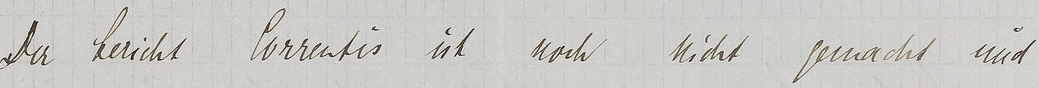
Der Bericht Correnti ist noch nicht gemacht und
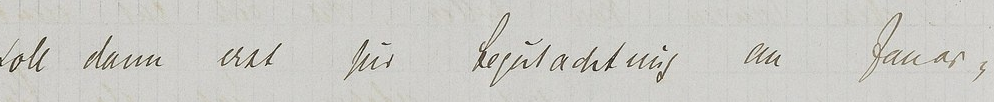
soll dann erst zur Begutachtung an Zanar-
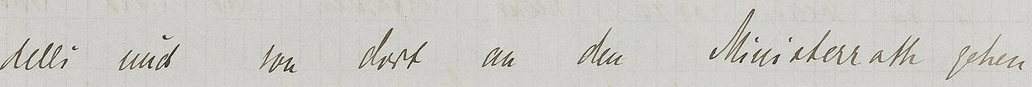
delli und von dort an den Ministerrath gehen.
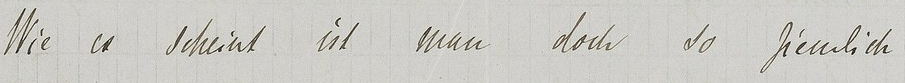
Wie es scheint ist man doch so ziemlich all-
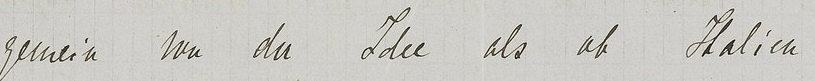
gemein von der Idee als ob Italien
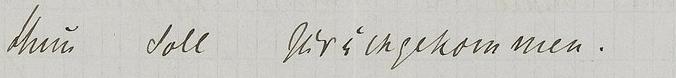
thun soll zurückgekommen.
